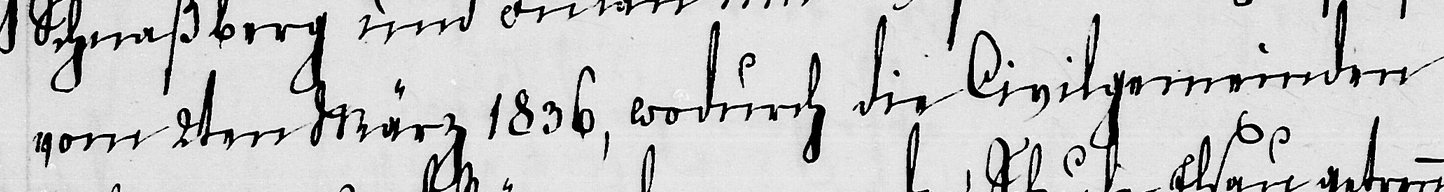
vom 2ten März 1836, wodurch die Civilgemeinden
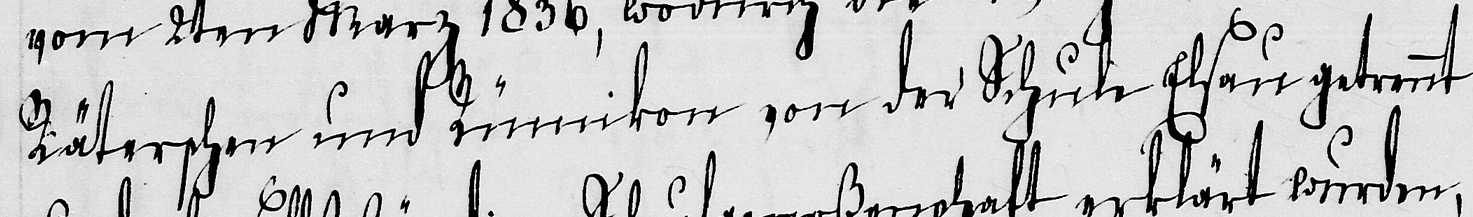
Räterschen und Rümikon von der Schule Elsau getren¬
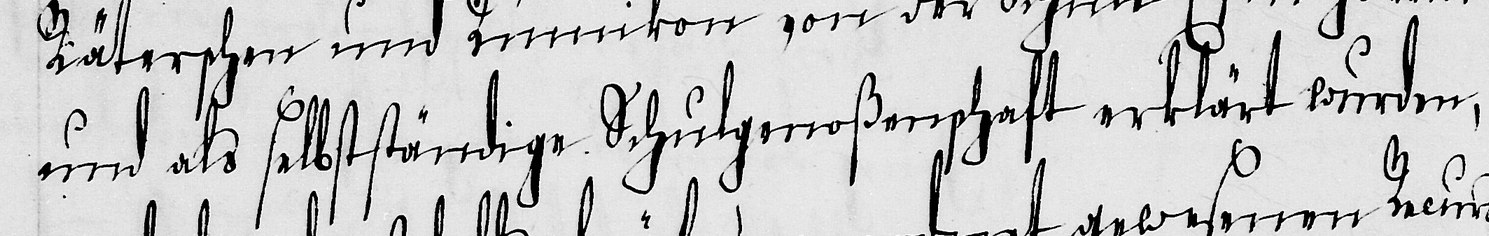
und als selbstständige Schulgenoßenschaft erklärt wurden,
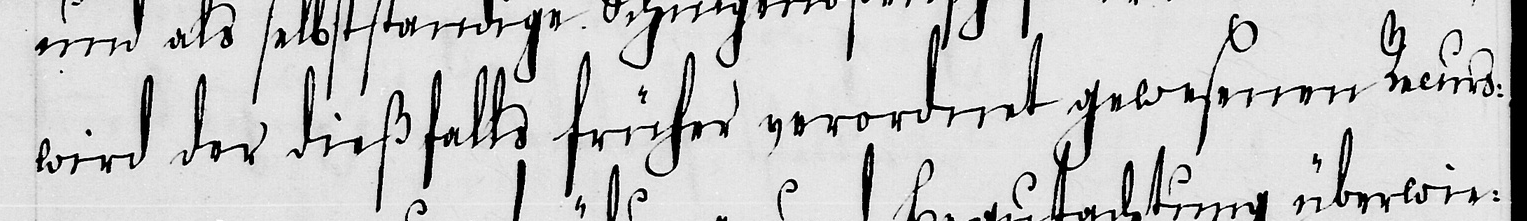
wird der dießfalls früher verordnet gewesenen Recur¬
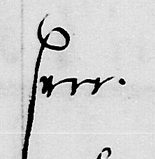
sen.
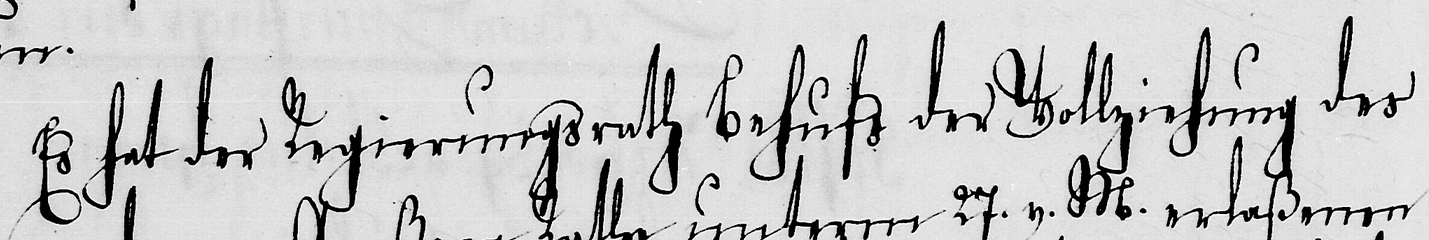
Es hat der Regierungsrath Behufs der Vollziehung des
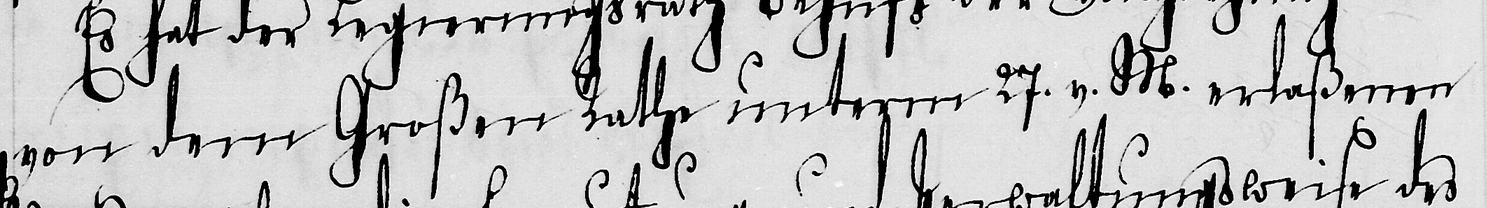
von dem Großen Rathe unterm 27. v. M. erlaßenen
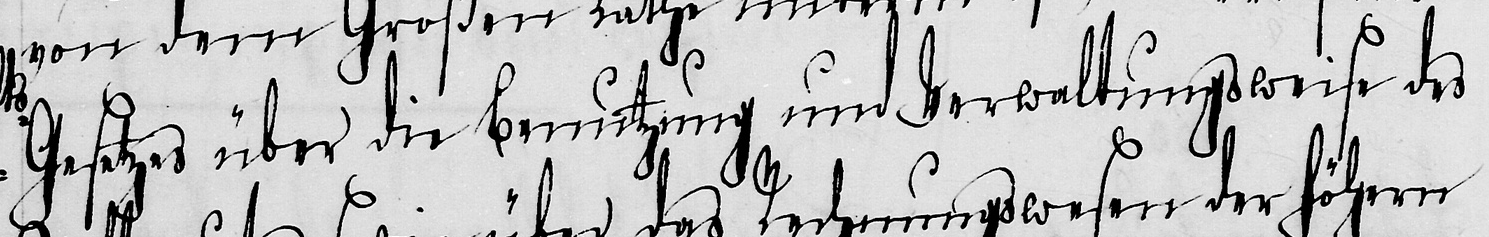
Gesetzes über die Benutzung und Verwaltungsweise des
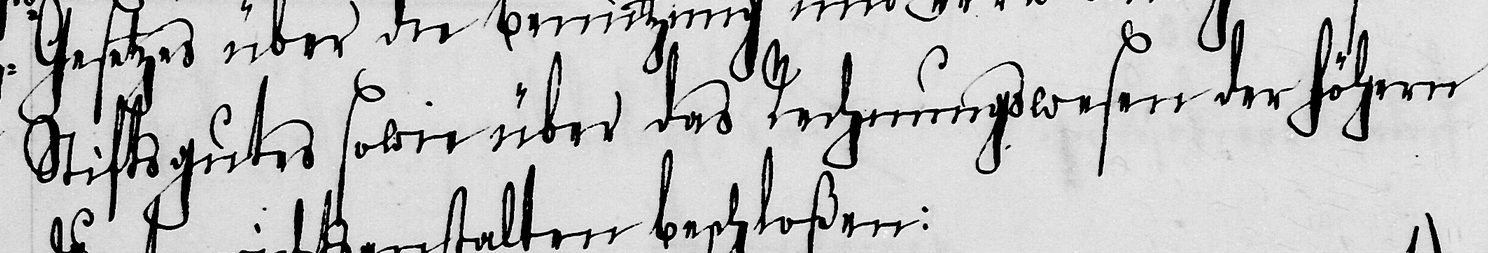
Stiftsgutes sowie über das Rechnungswesen der Höhern
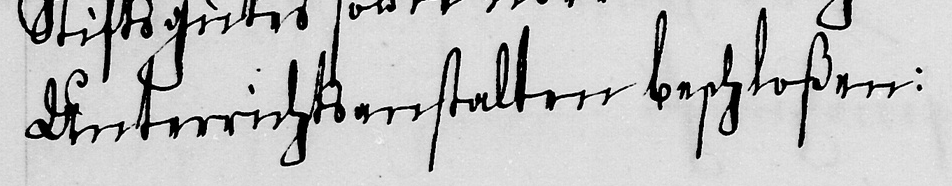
Unterrichtsanstalten beschloßen:
